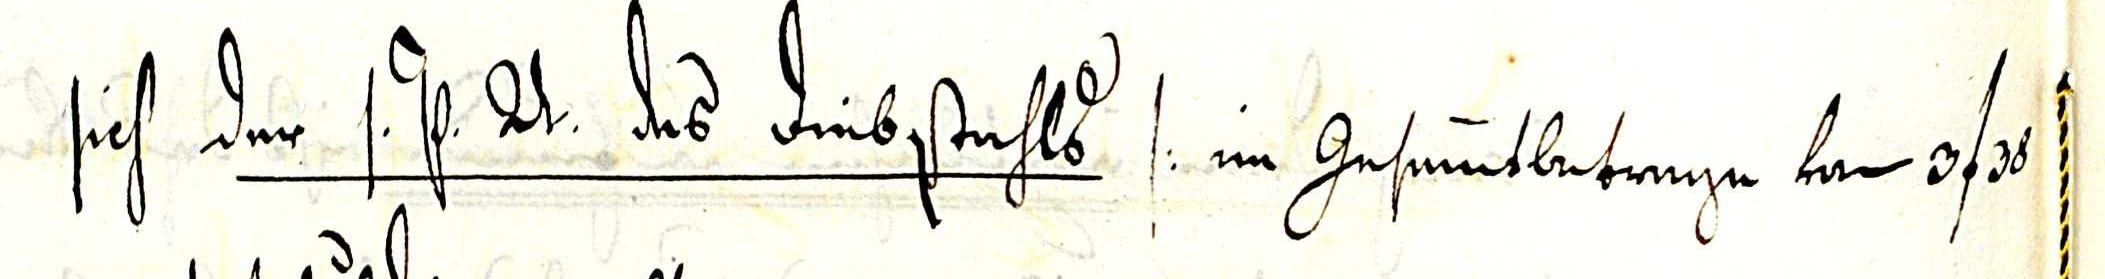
sich der 1. St. A des Diebstahls (m Gesammtbetrage von 3/38
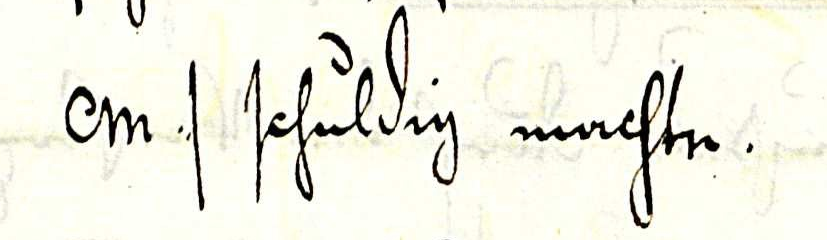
OW) schuldig machte.
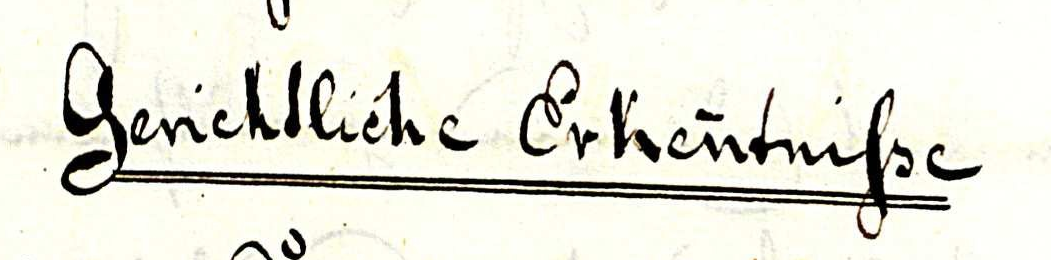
Gerichtliche Erkenntnisse
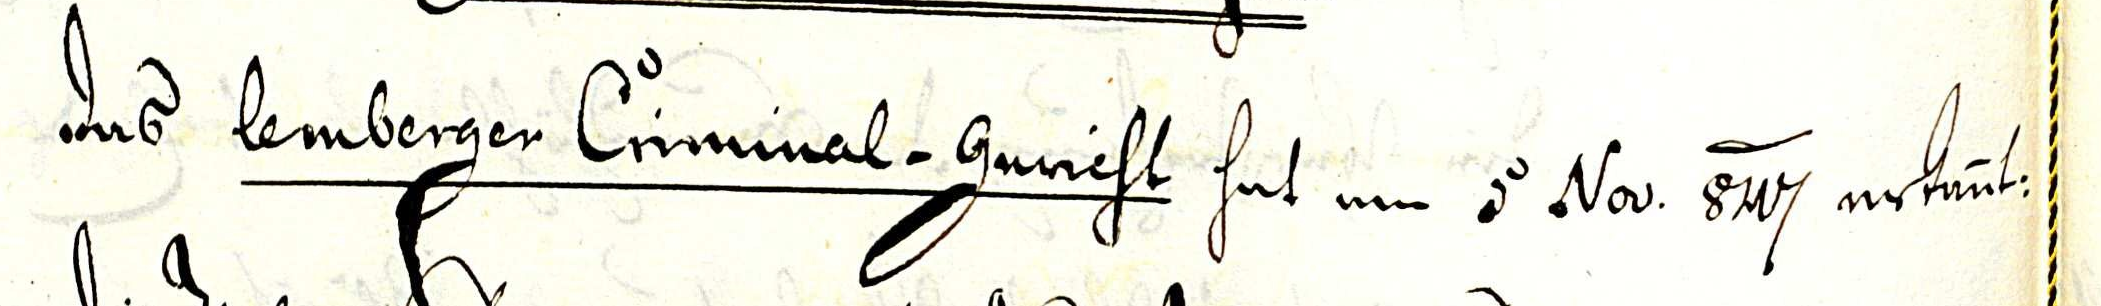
Das Lemberger Criminal-Gericht hat am 5 Nov. 847 erkannt:
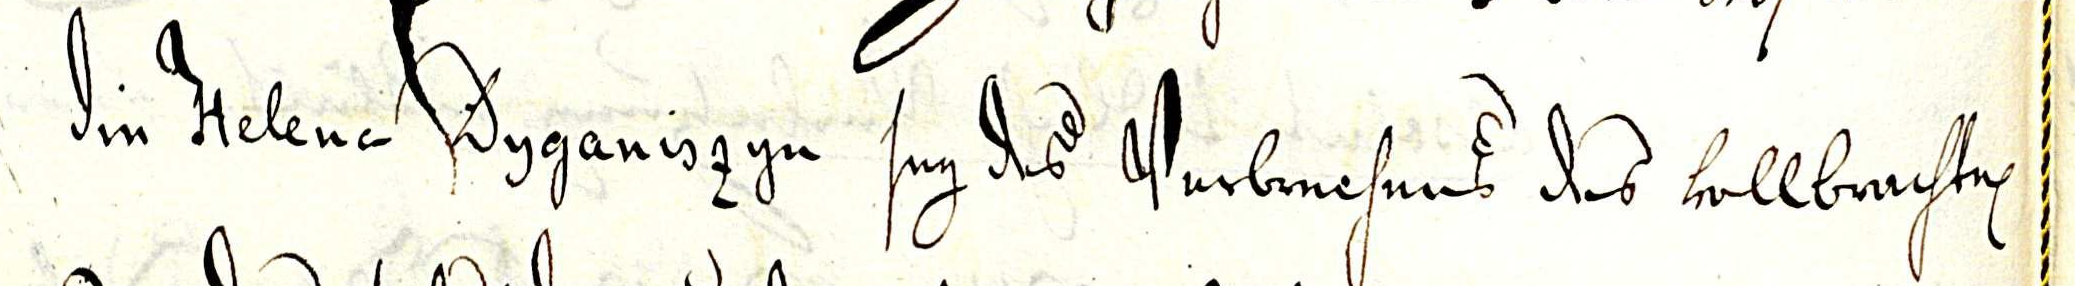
Die Helene Dyganiszyn sey des Verbrechens des vollbrachten
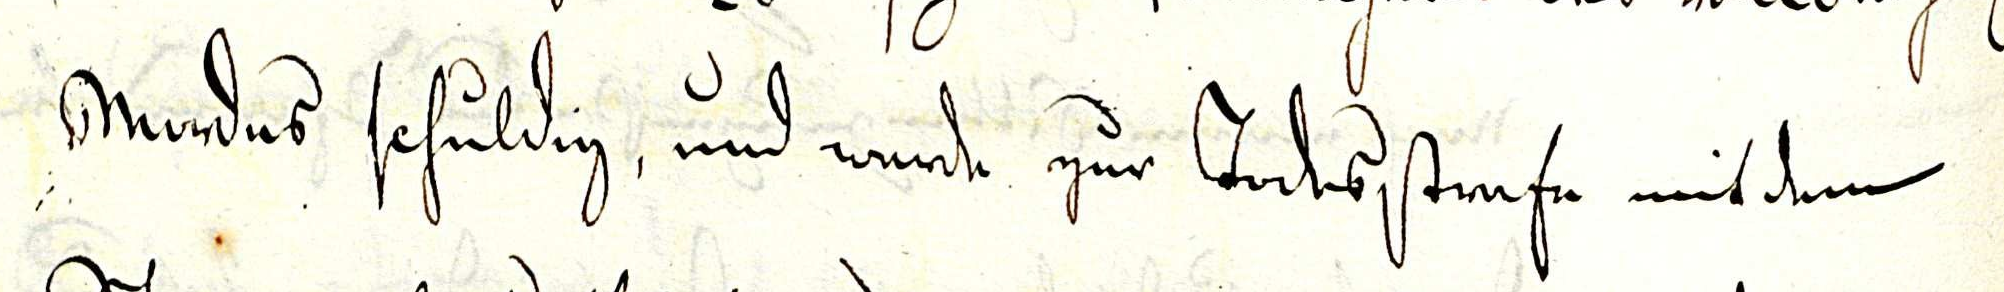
Mordes schuldig, und wurde zur Todesstrafe mit dem
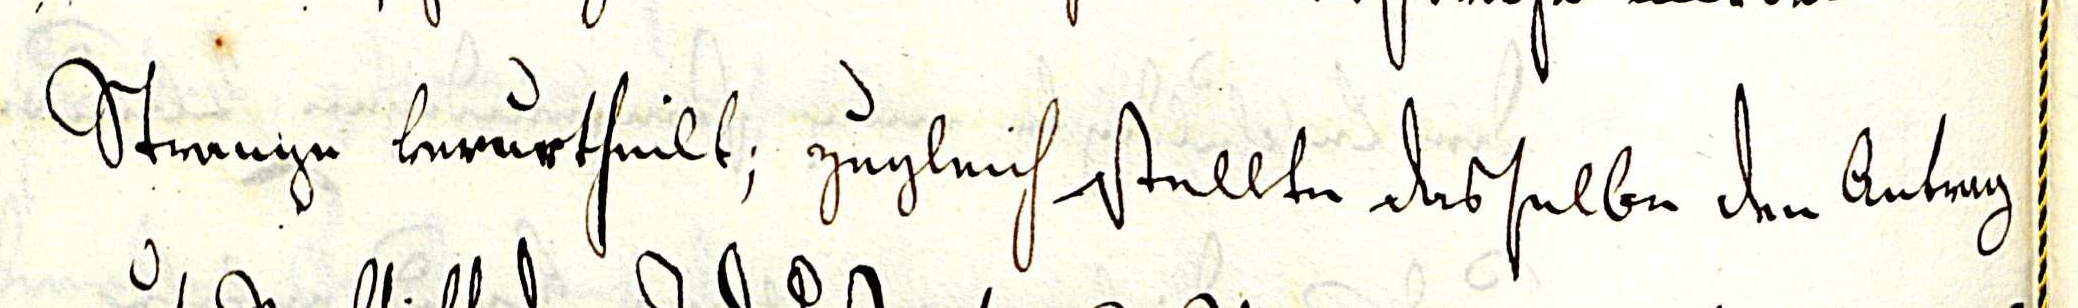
Strange verurtheilt; zugleich stellte dasselbe den Antrag
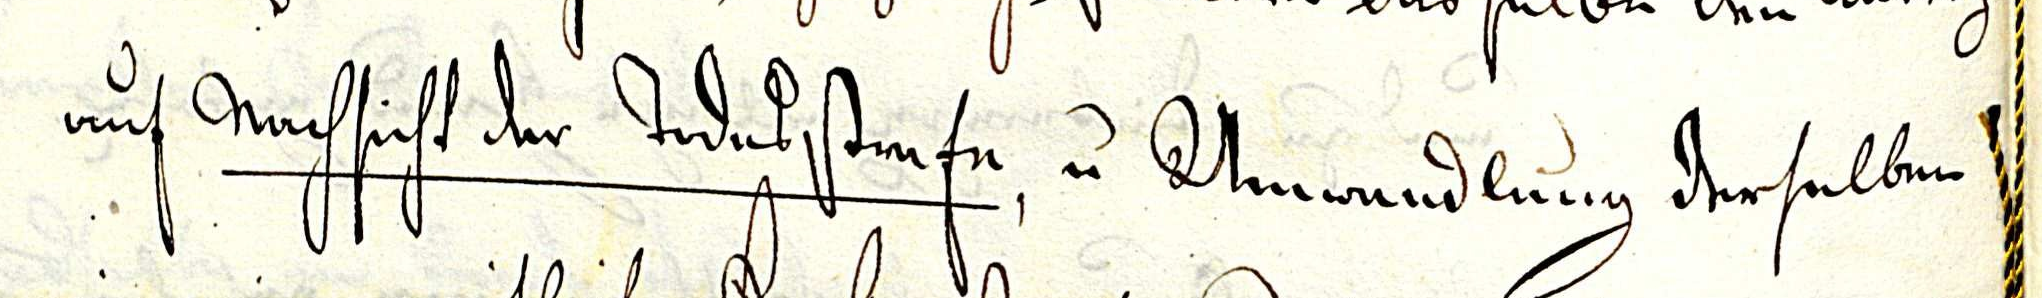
auf Nachsicht der Todesstrafe, u. Umwandlung derselben
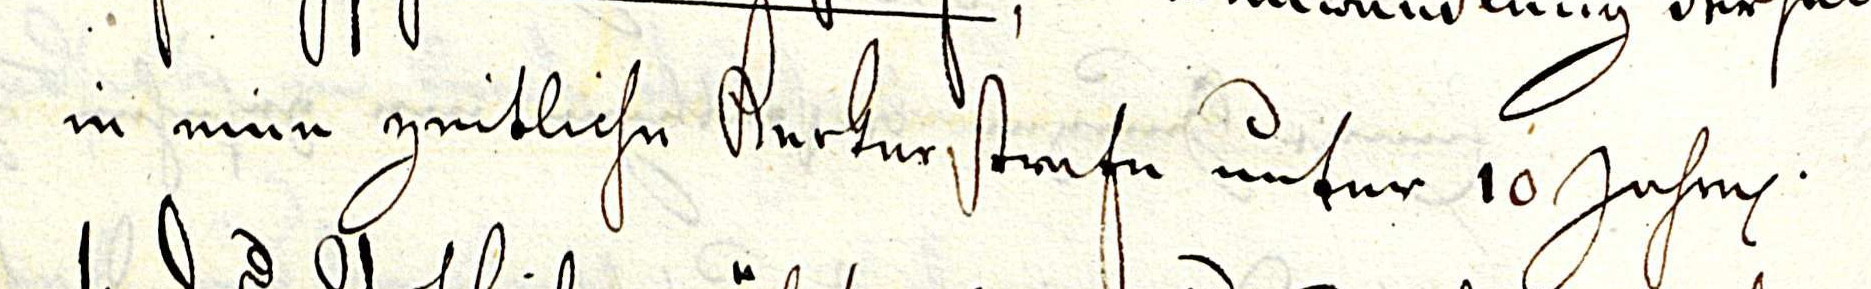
in eine zeitliche Kerkerstrafe unter 10 Jahren.
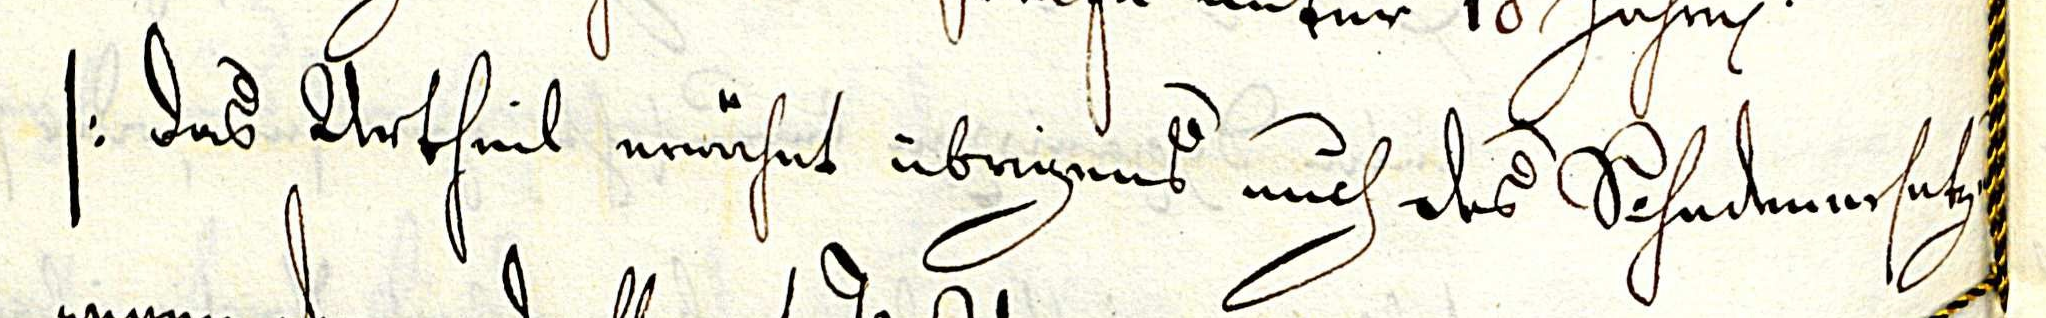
(Das Urtheil erwähnt übrigens auch des Schadenersatz
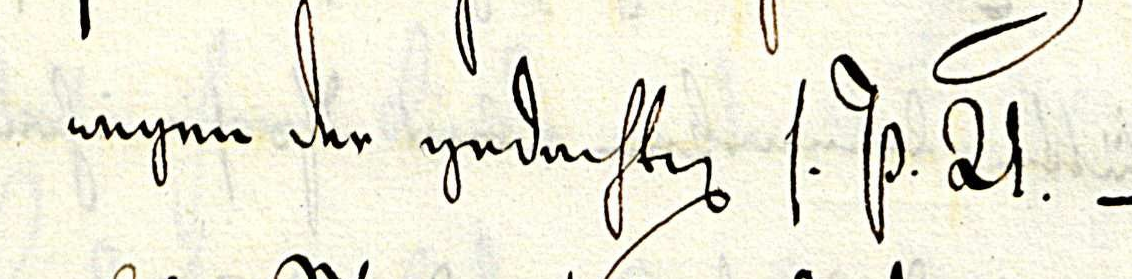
wegen der gedachten 1St.21)
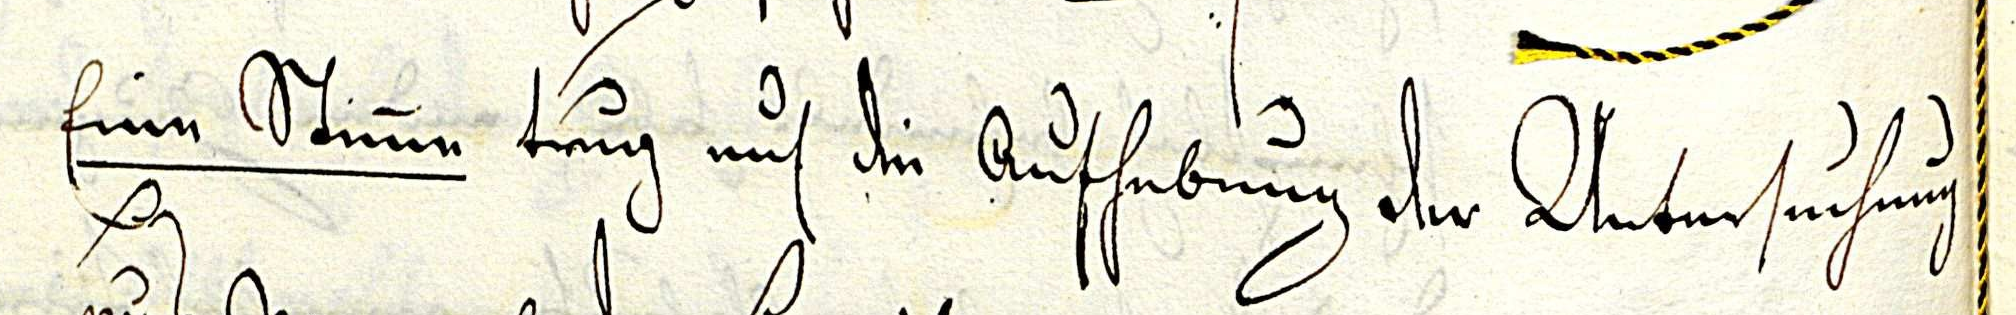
Eine Stimme trug auf die Aufhebung der Untersuchung
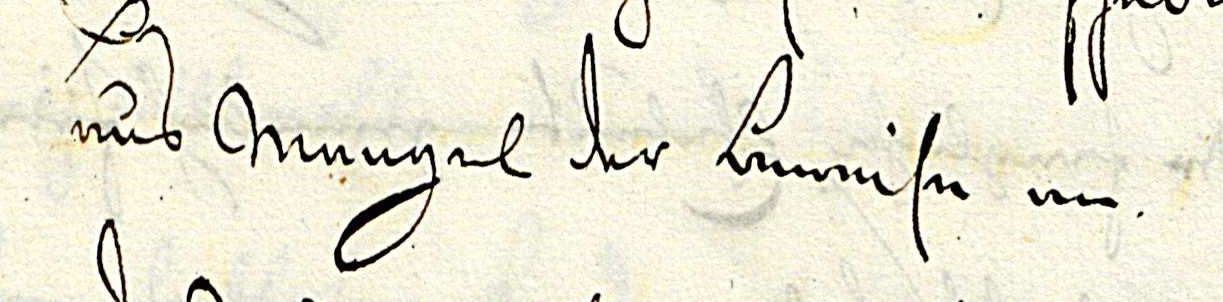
aus Mangel der Beweise an.
